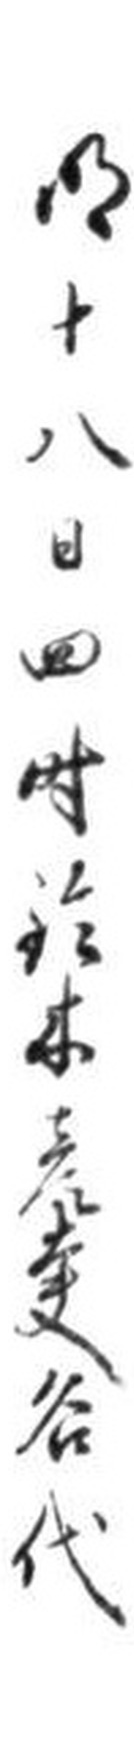明十八日四時鈴木彦太夫名代
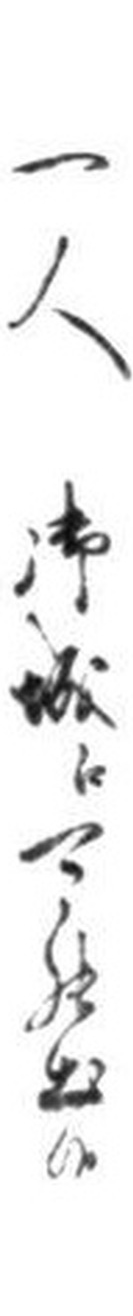一人御城江可罷出候
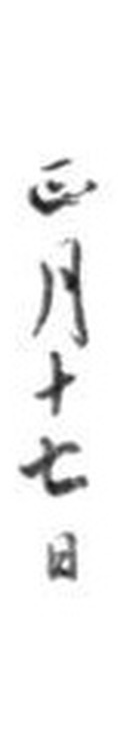正月十七日
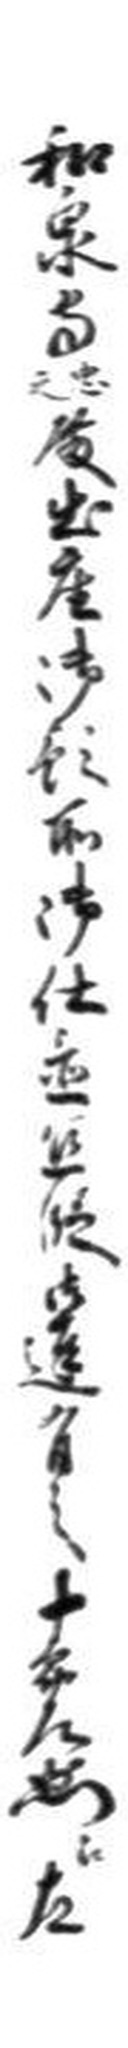之殿出座御預所御仕置宜段御逢有之十郎左衛門江左
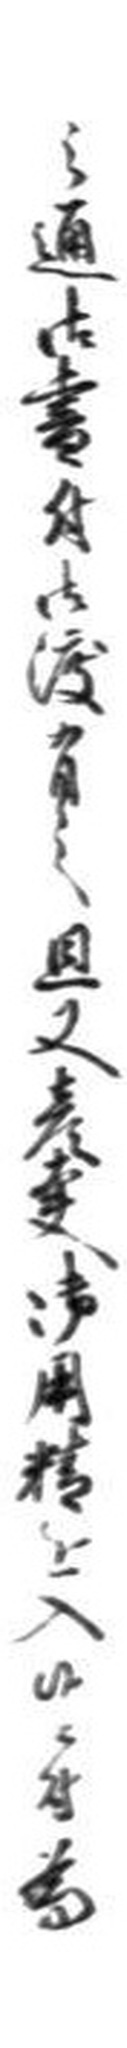之通御書付御渡有之且又彦太夫御用精を入候ニ付為
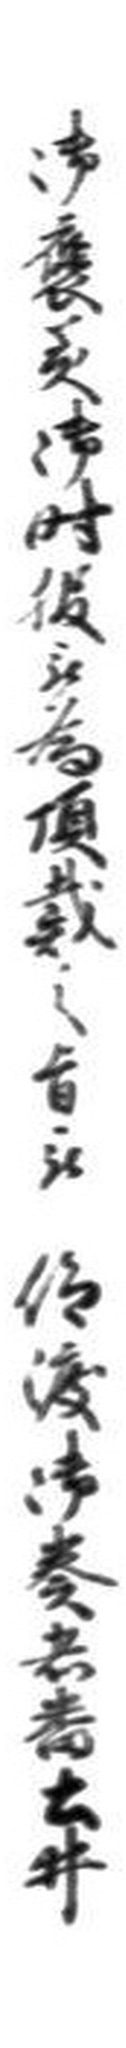御褒美御時服被為頂戴之旨被仰渡御奏者番土井
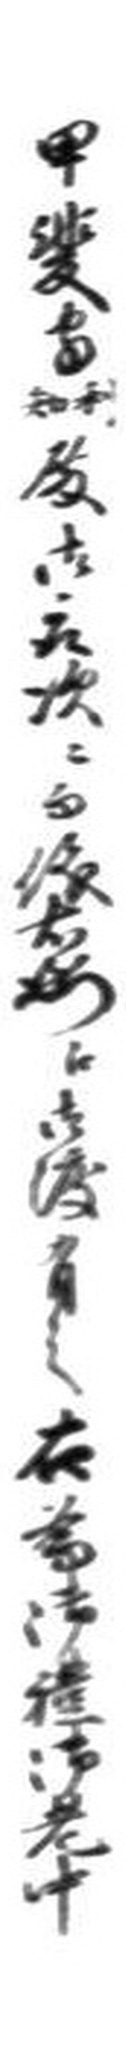知殿御取次ニ而儀右衛門江御渡有之右為御礼御老中
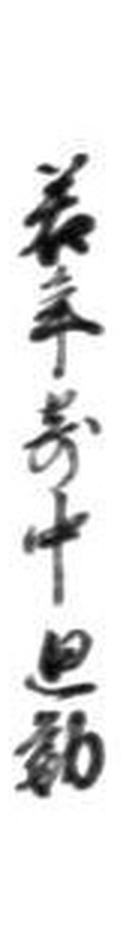若年寄中廻勤
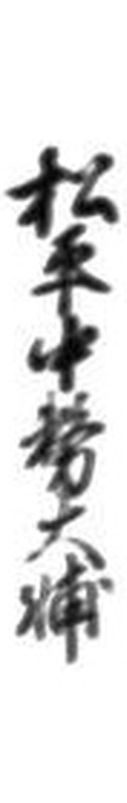松平中務大輔
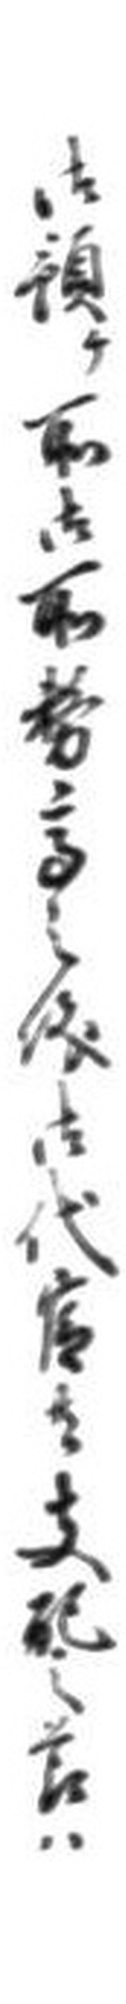御預ケ所御所務高之儀御代官共支配之節ハ
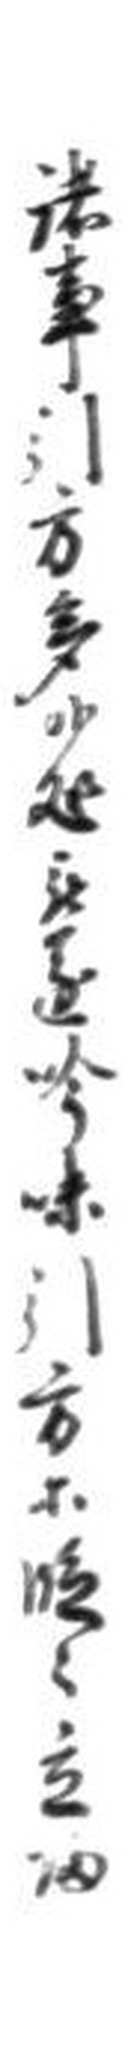諸事引方多候処被遂吟味引方等段々立帰
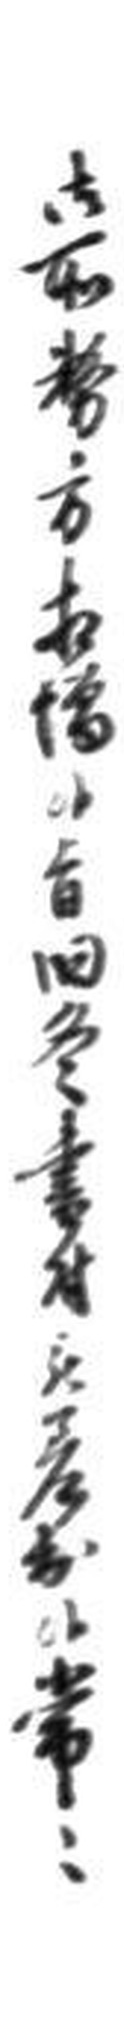御所務方相増候旨旧冬書付被差出候常々
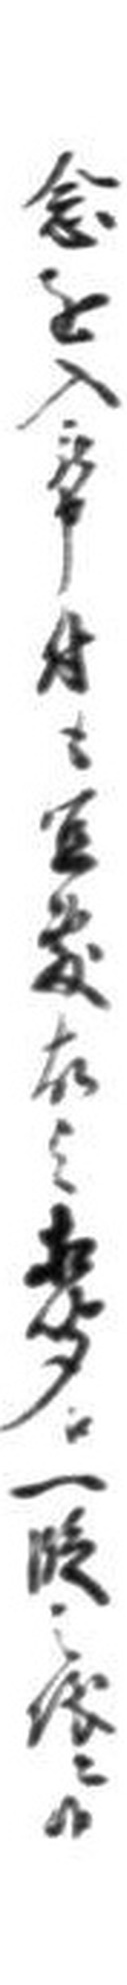念を入被申付も宜敷故与相聞江一段之儀ニ候

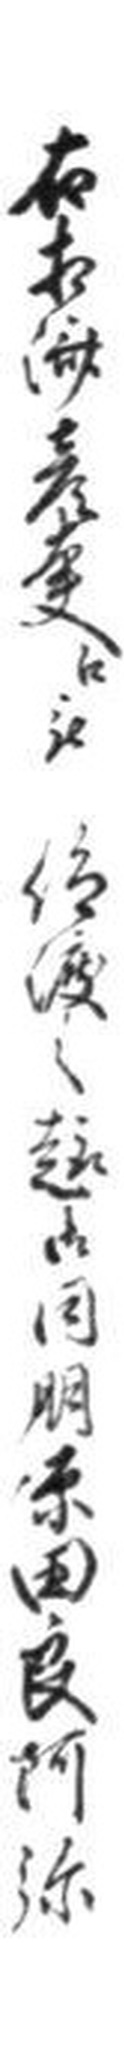右相済彦太夫江被仰渡之趣御同朋原田良阿弥
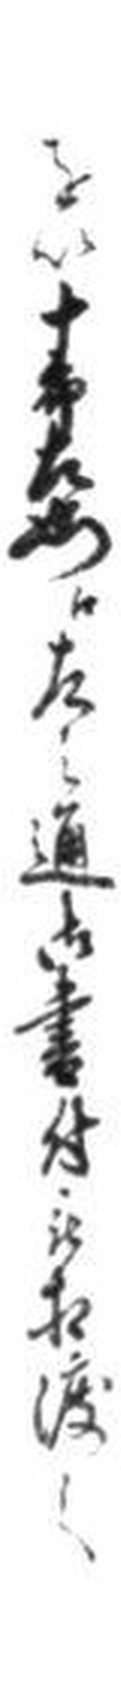を以十郎左衛門江左之通御書付被相渡之
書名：家譜 三十六 宗昌公 従享保八年到同九年
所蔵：福井県文書館 Fukui Prefectural Archives
